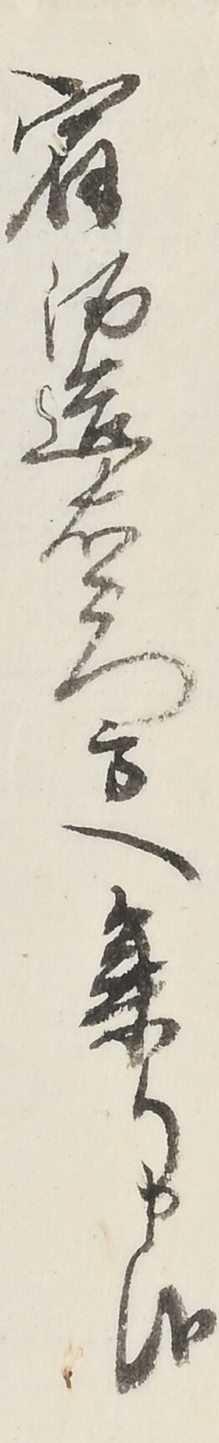宿酒造右衛門方へ参り申候

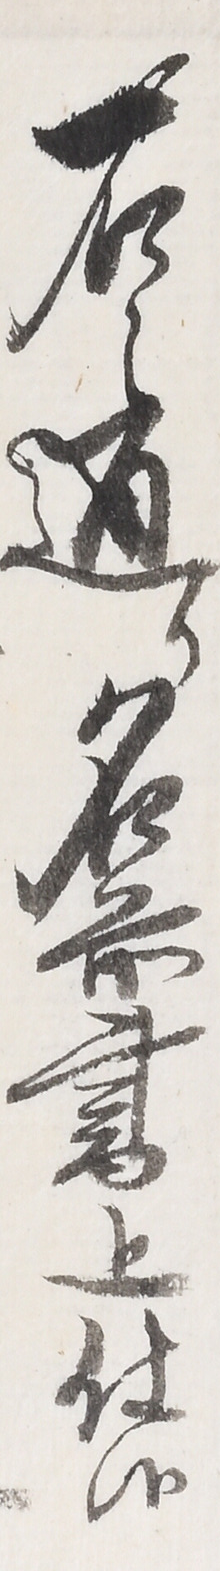右之通り名前書上仕候
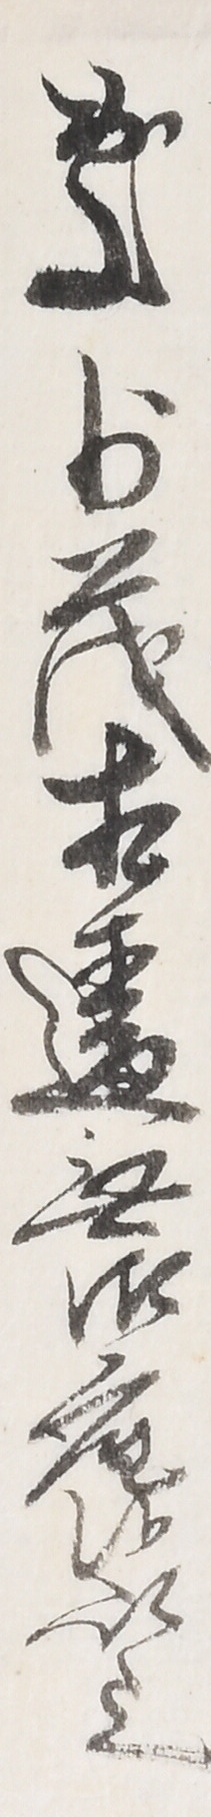処少も相違無御座候以上
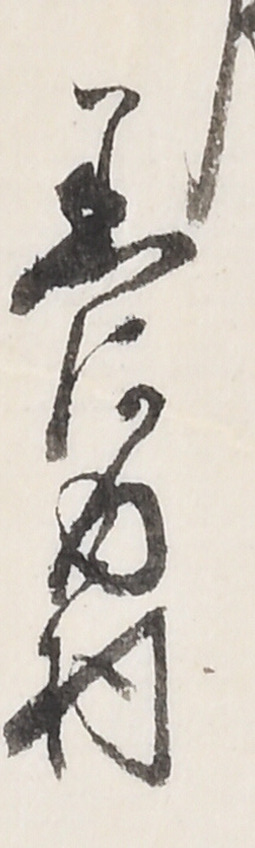黒河内村
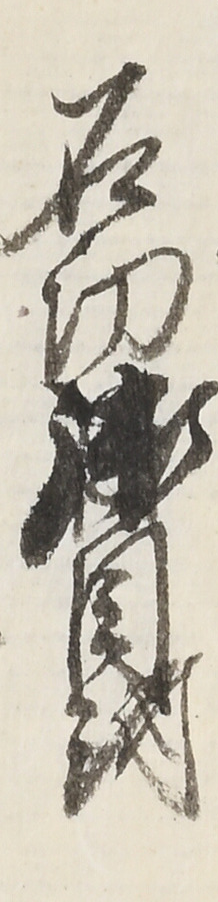石切御目附
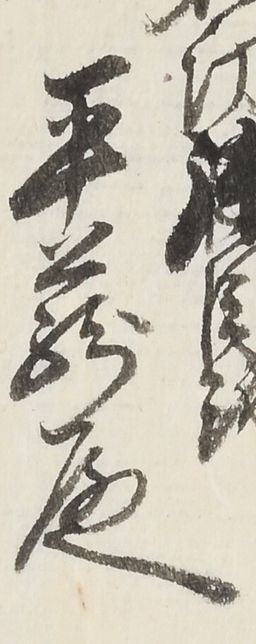平蔵殿
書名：安政六己未年二月日石切名前書上帳
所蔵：伊那市立高遠町図書館・合同会社AMANE
